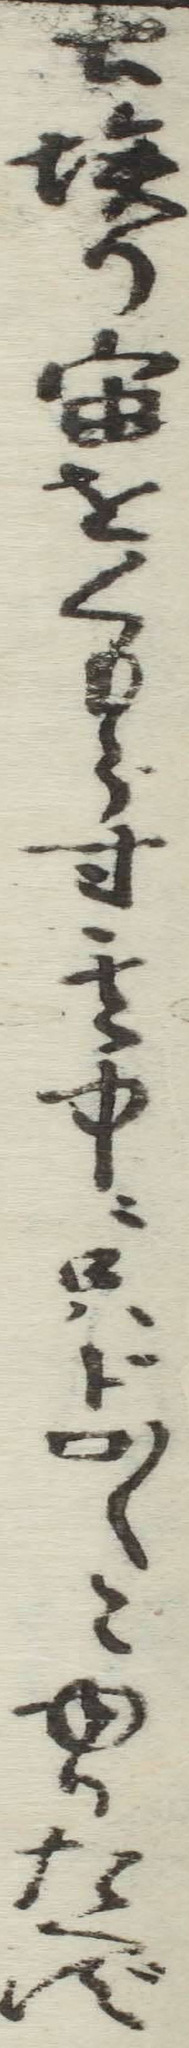土埃り宙をくもらす其中に只ドロ〳〵とゆりたへず
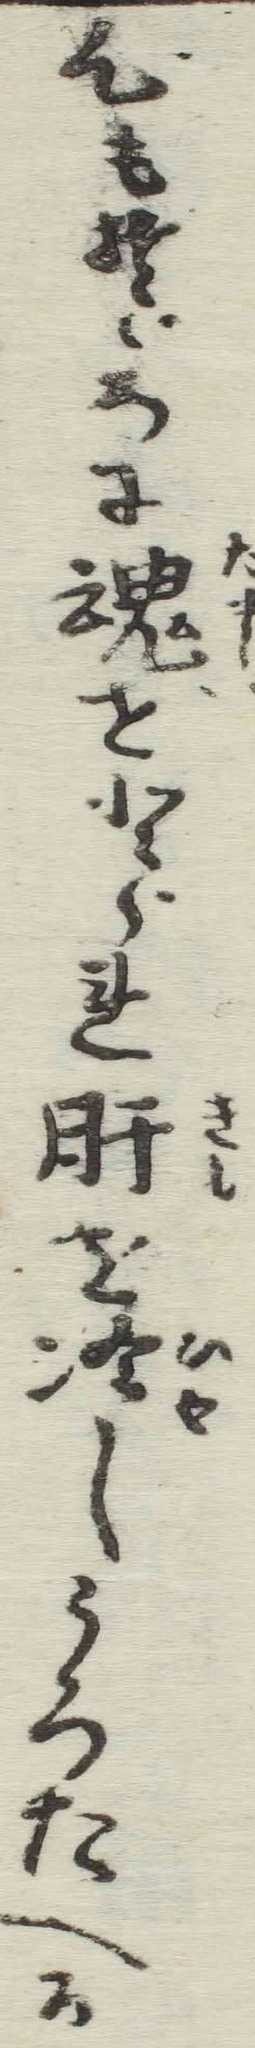心もそゞろに魂をとられ肝を冷しうろたへる
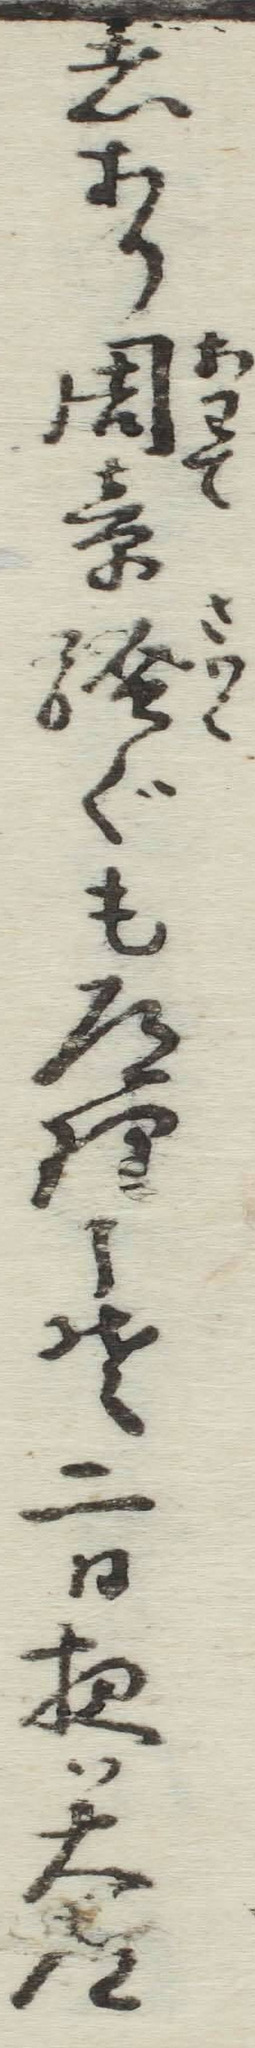者あり周章騒ぐも道理こそ二日夜は大道
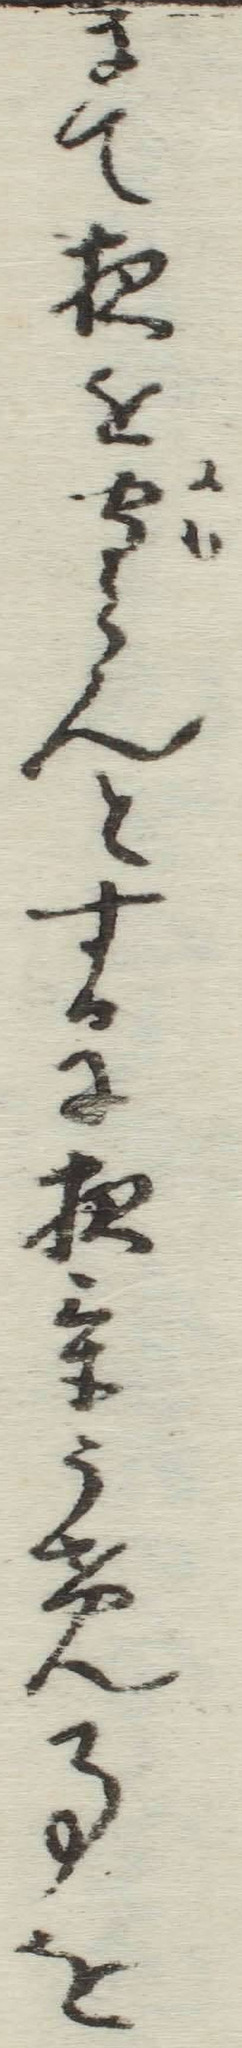にて夜を守らんとするに夜気うけん事を
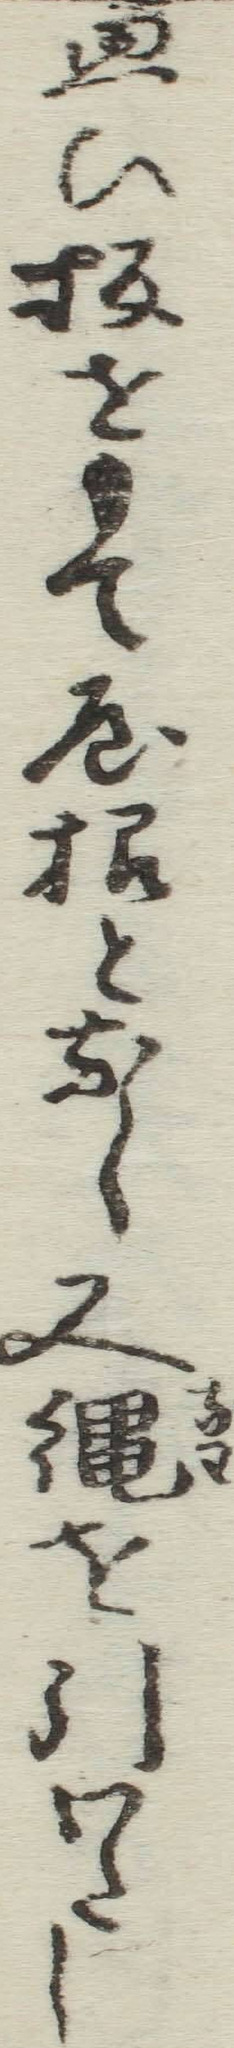思ひ板をもて屋根となし又縄を引わたし
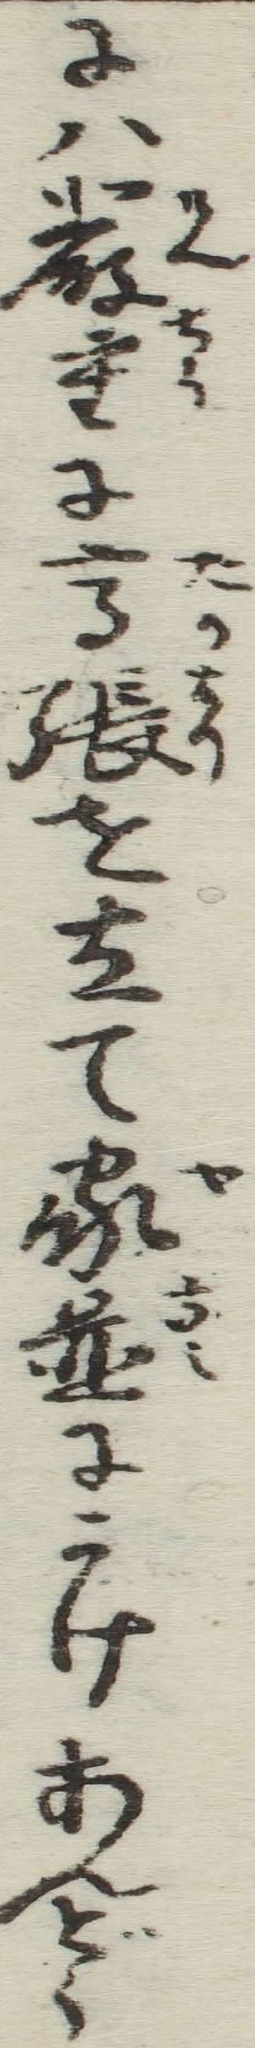には厳重に高張を立て家並にかけあんどう
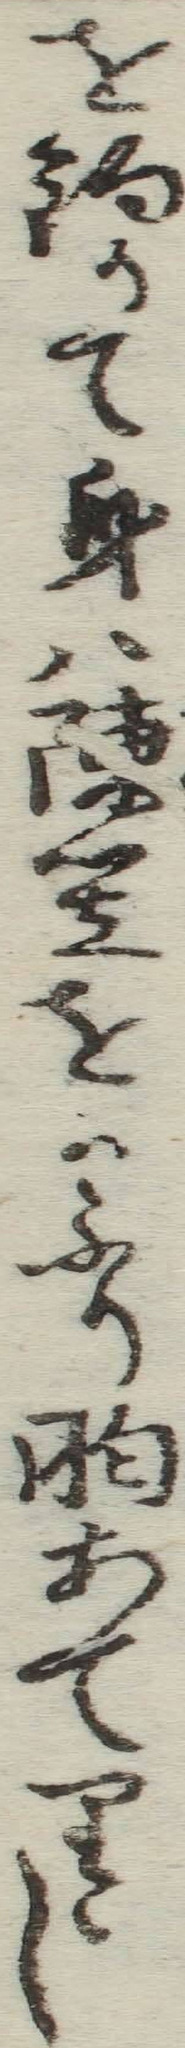を釣りて身は陣笠をかふり胸あてりゝし

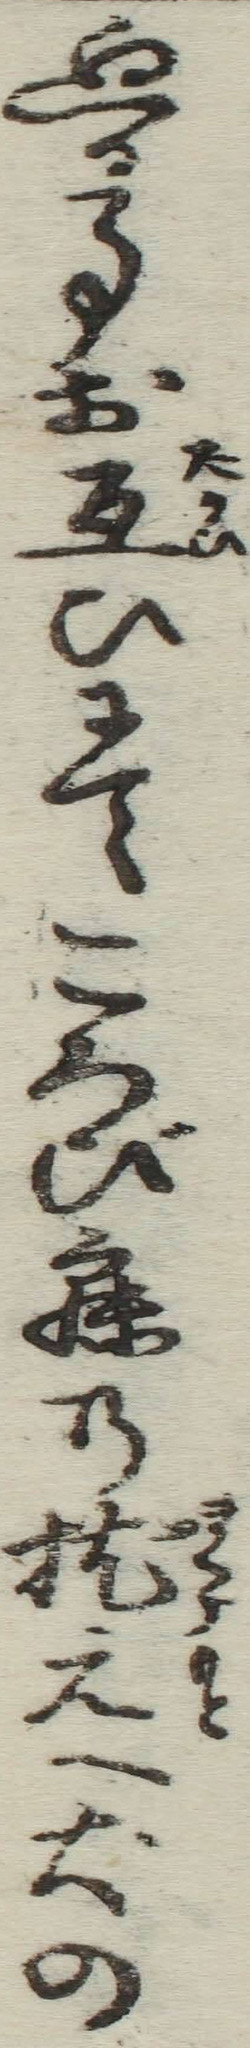廻る事お互ひにてころび寝の枕元へ犬の
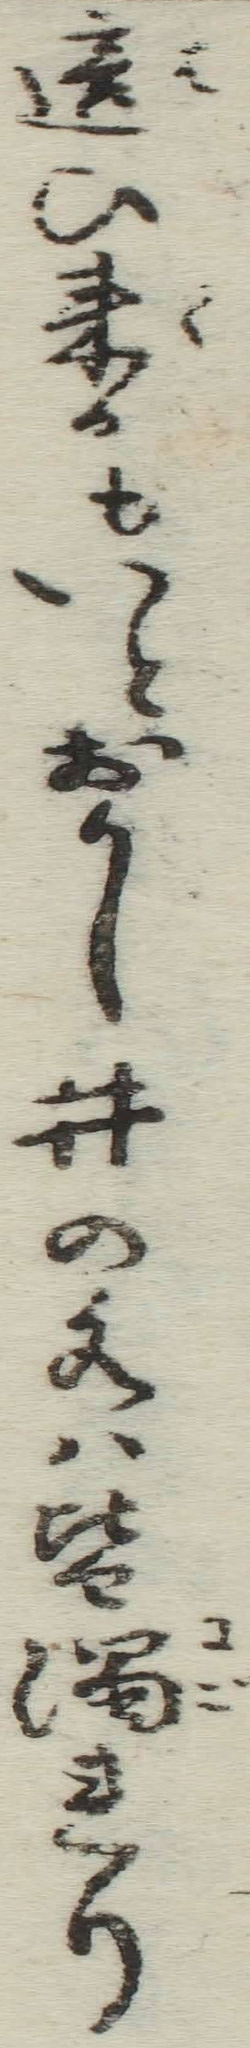這ひ来るもいとおかし井の水は皆濁れり
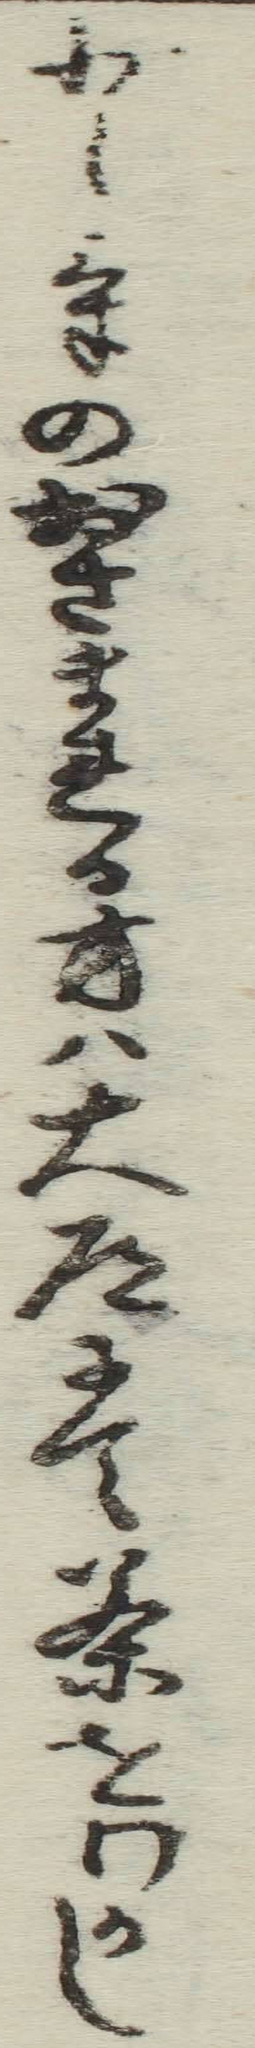少し気のおさまれる方は大道にて茶をわかし
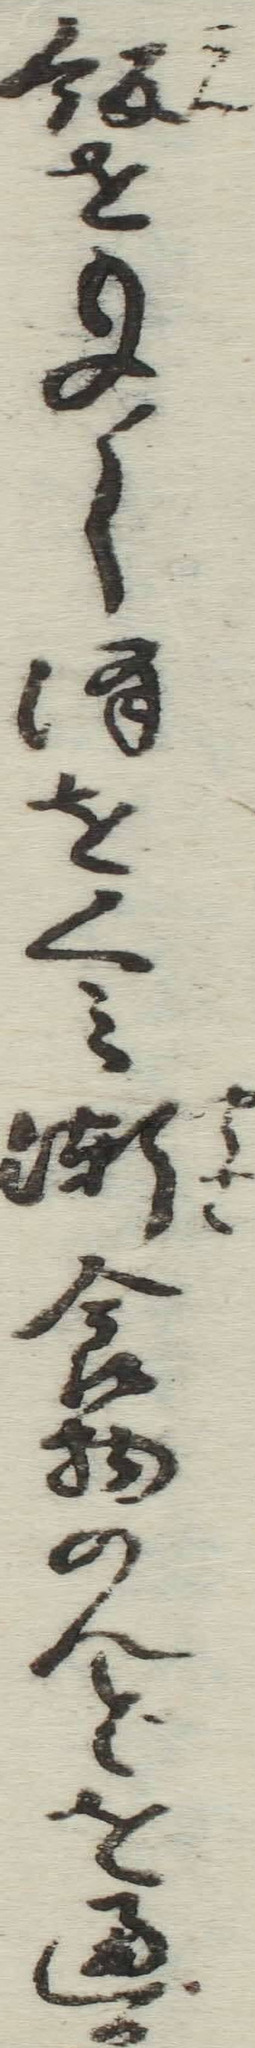飯をものし酒をくみ漸食物のんどを通る
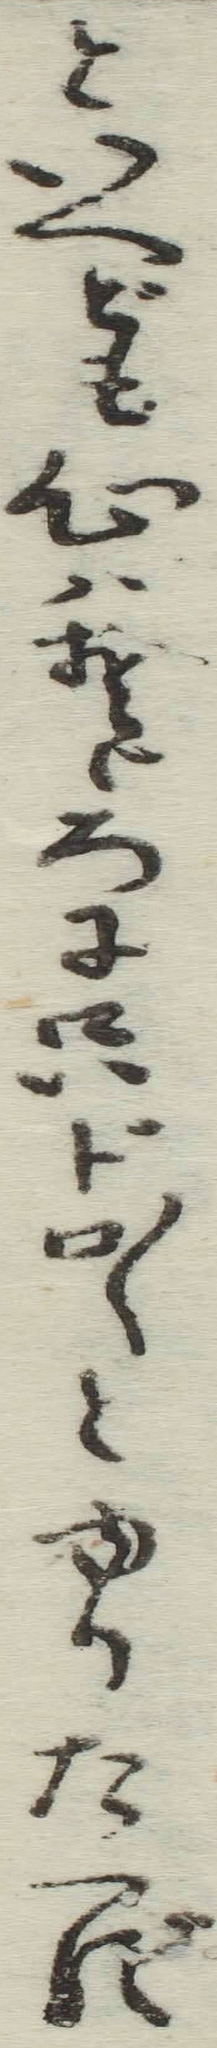といへども心はおどろに只ドロ〳〵とゆりたへづ
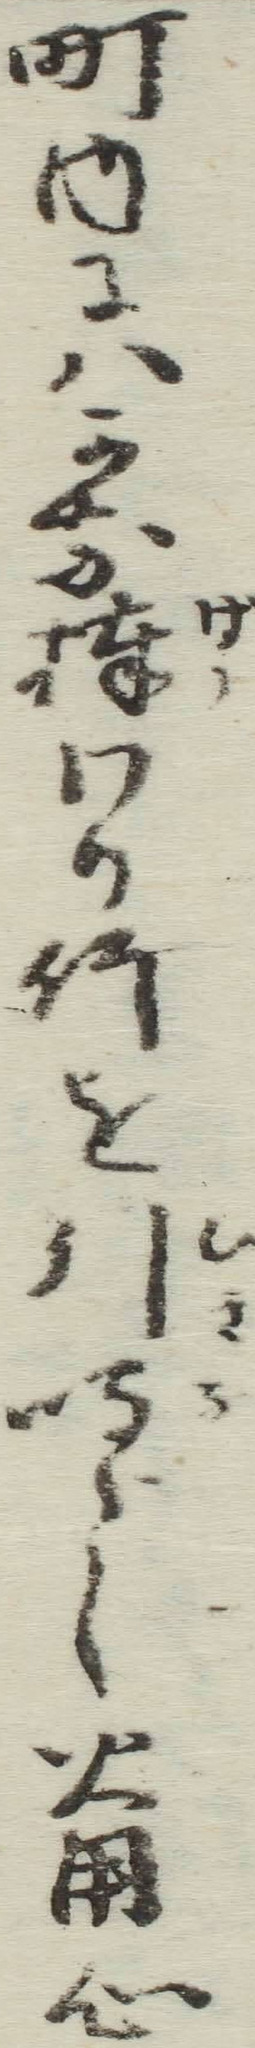町内にはかな棒けり行を引鳴らし火用心
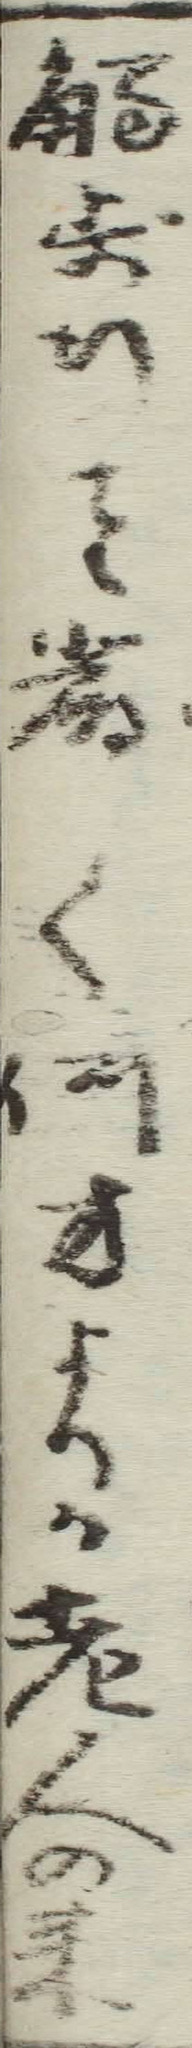触歩行を厳しく何方よりか老人の来
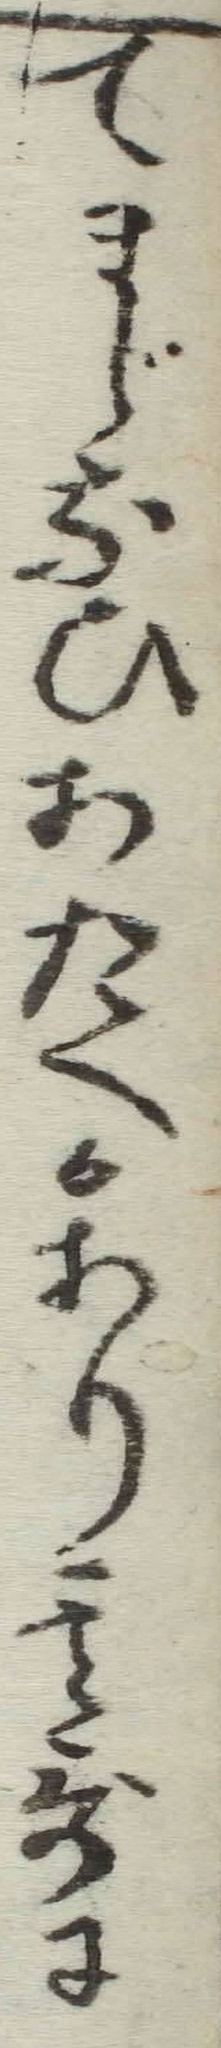てまじなひあたへるあり其歌に
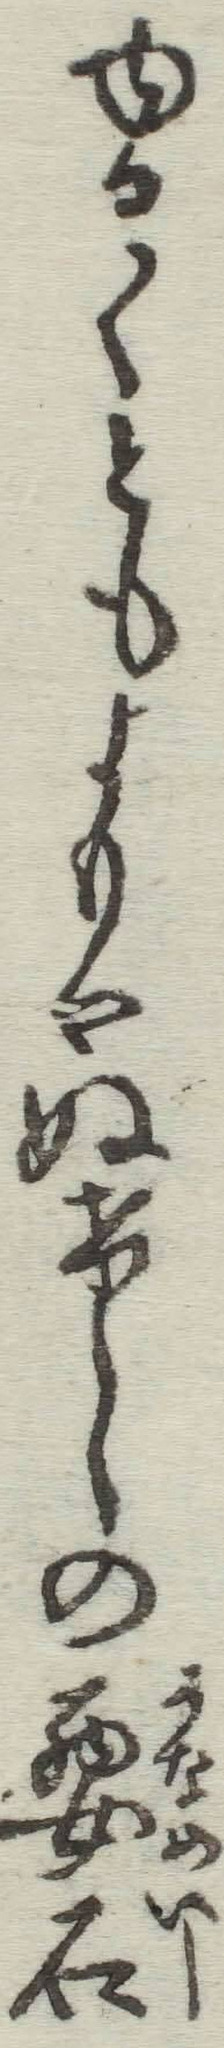ゆるくともよもやぬけしの要石
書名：地震奇談／平安万歳楽
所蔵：国文学研究資料館
